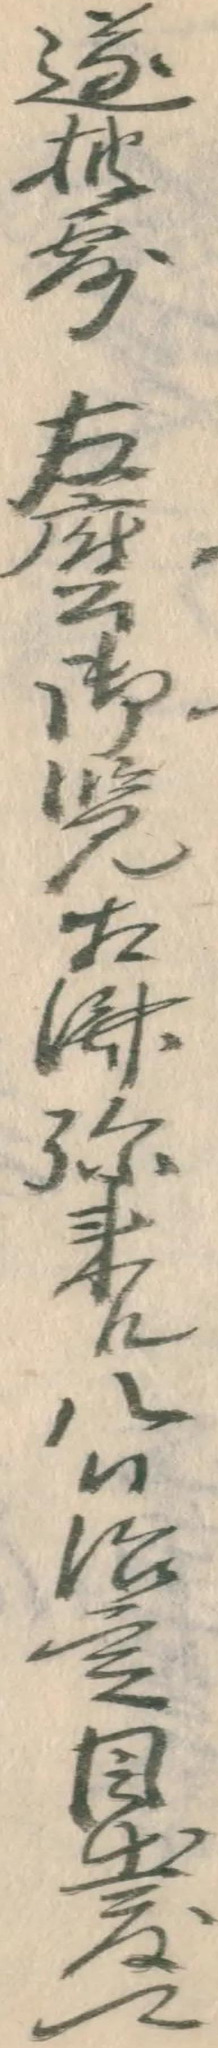遂披露左府公御覧相済弥来ル八日治定目出度可
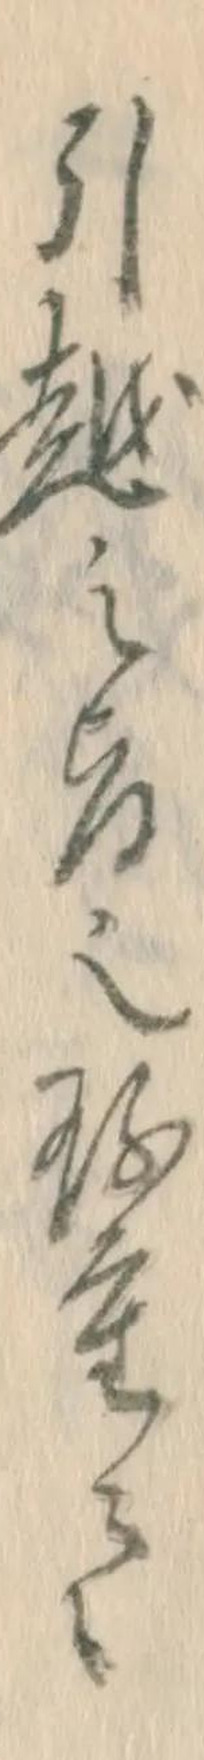引越之旨也珍重々々
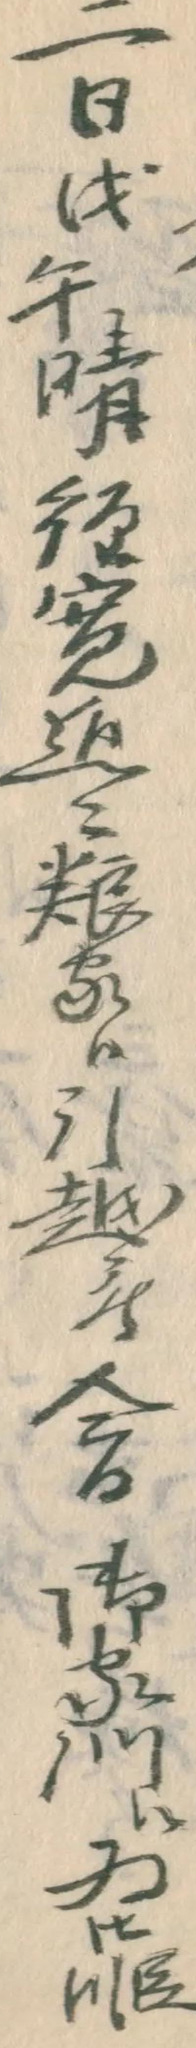二日戊午晴経寛近々養家え引越ニ付今日御家門え為御暇
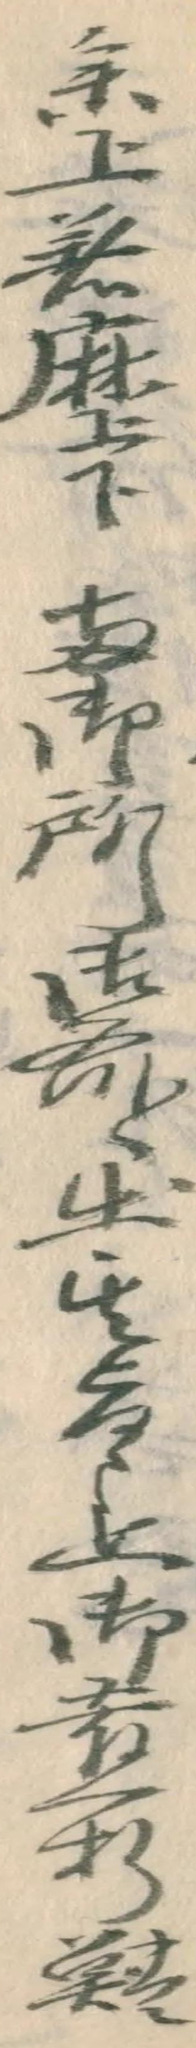参上着麻上下両御所御前ヘ出其旨申上御肴一折鮭
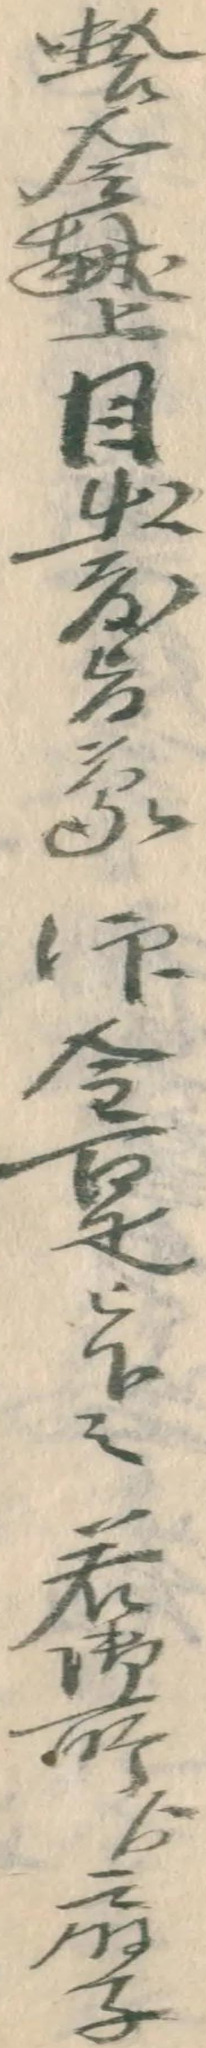蛤令献上目出度旨蒙仰金百疋被下之若御所ゟ扇子
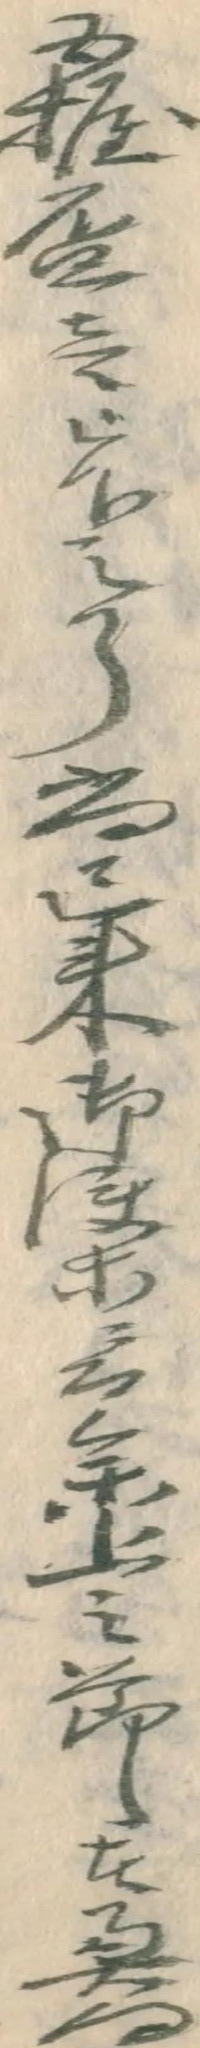五拾盃壱被下之了尚已来御使等ニ而参上之節者奥向
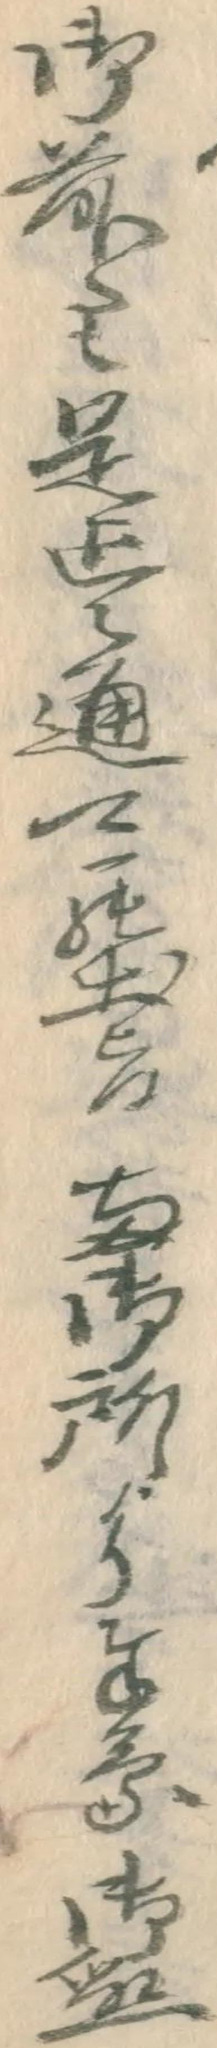御前へも是迄之通可罷出旨両御所より奉蒙御懇

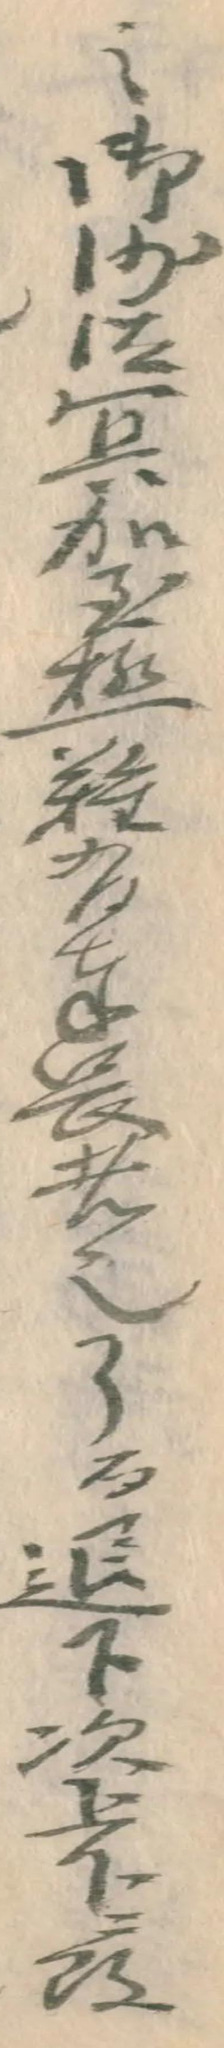之御沙汰冥加至極難有奉畏者也了而退下次上下ニ改
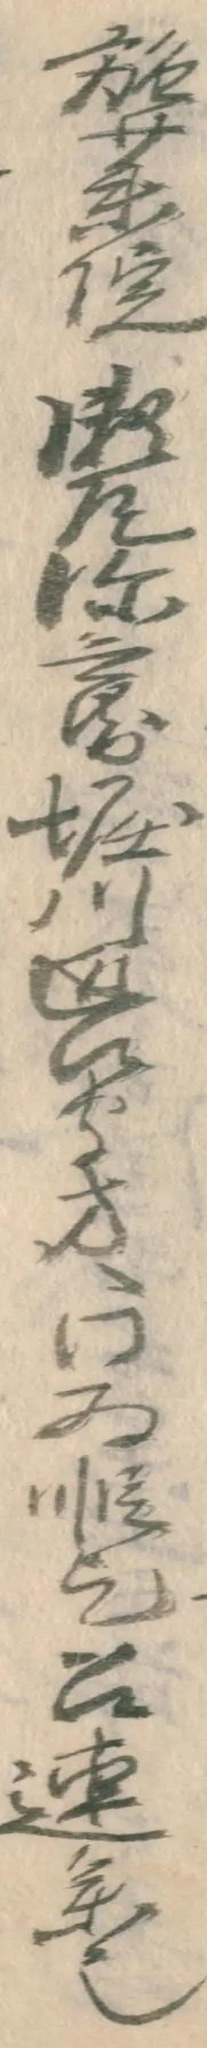施薬院瀬尾弥兵衛堀川近江守方へ同為暇乞召連参也
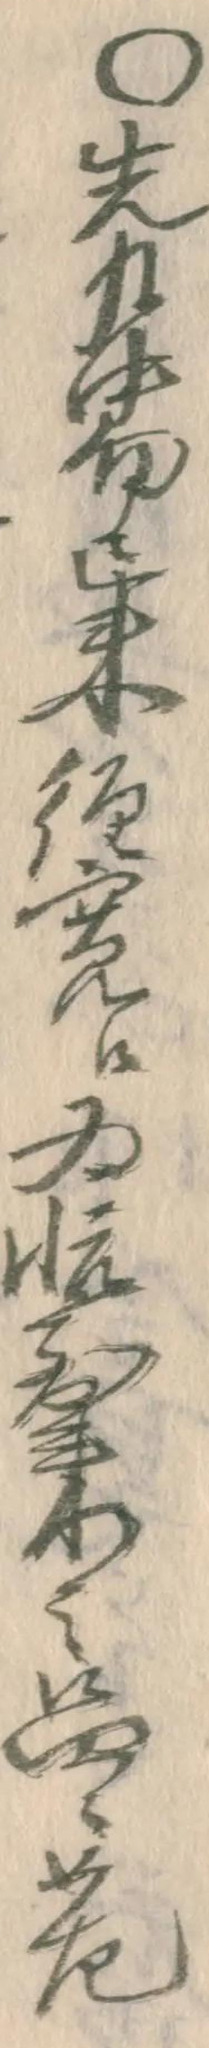○先月中旬已来経寛え為祝到来之品ニ如左
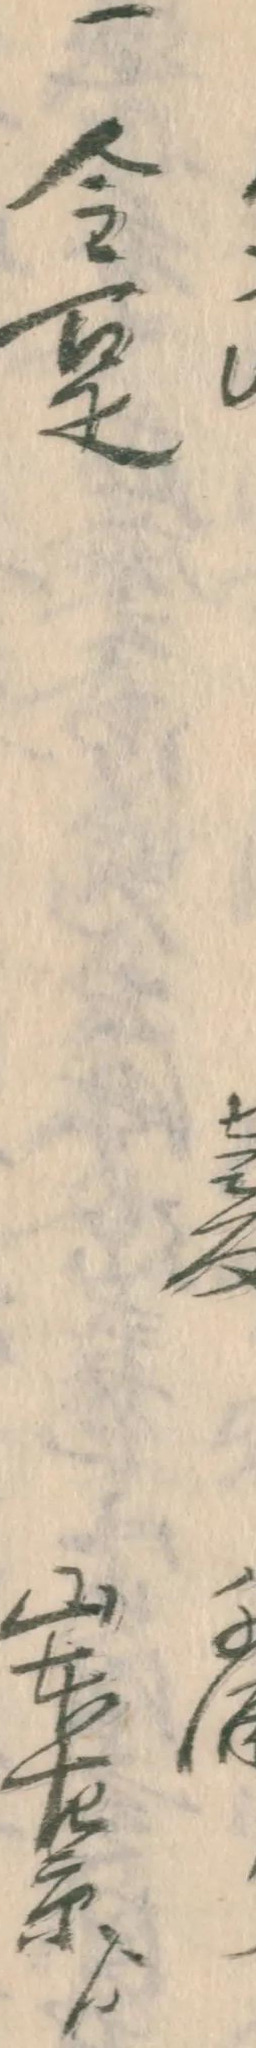一金百疋山本左京ゟ
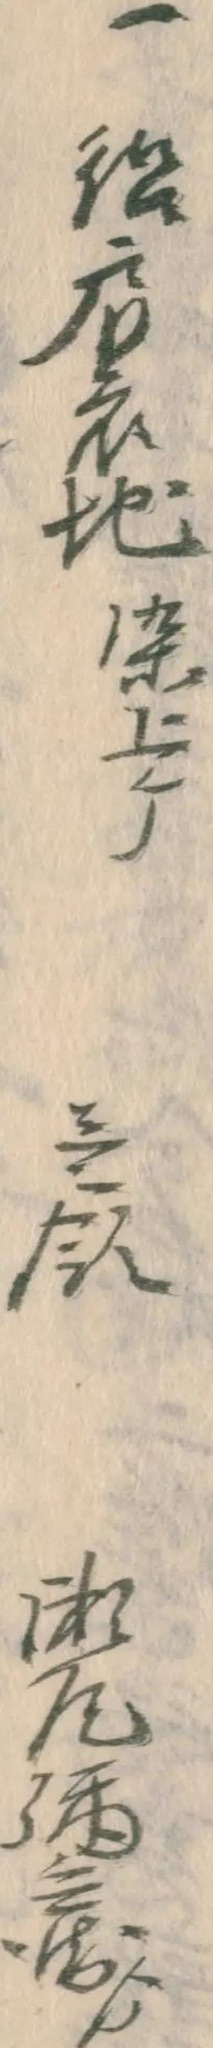一役肩衣地染上ケ壱領瀬尾弥兵衛ゟ
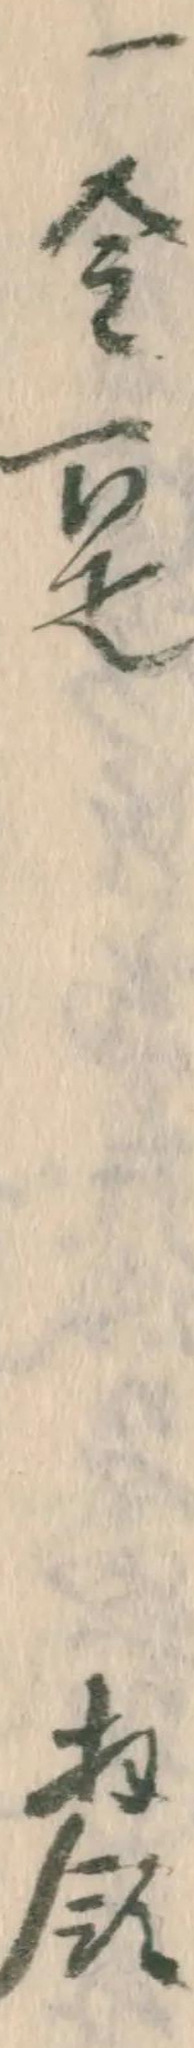一金百疋拝領
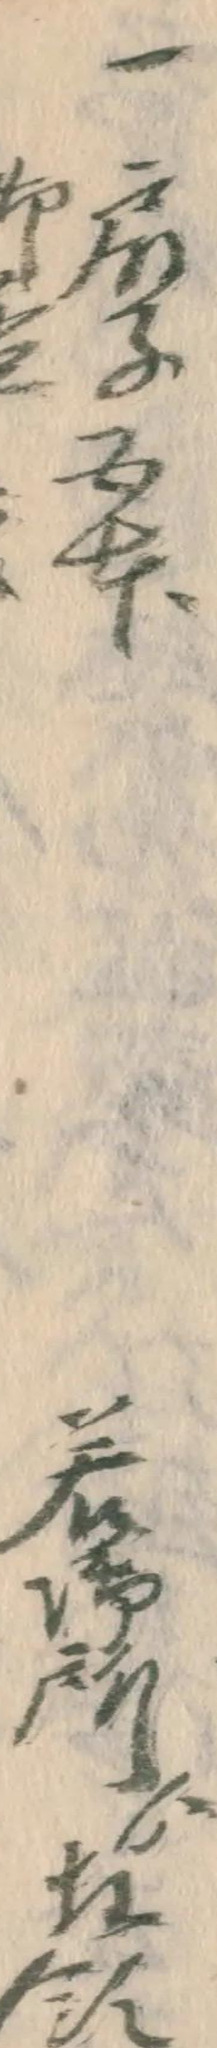一扇子五本若御所ゟ拝領
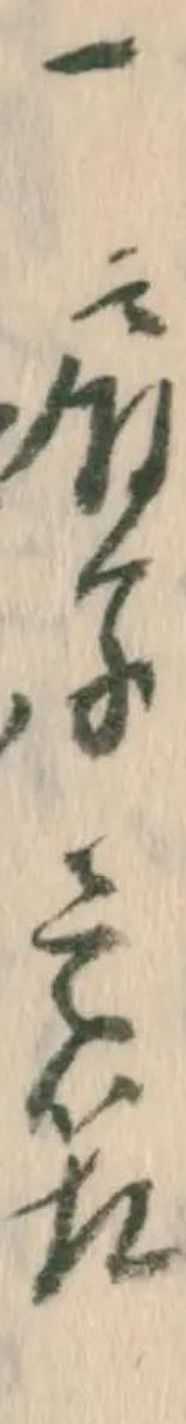一扇子壱箱
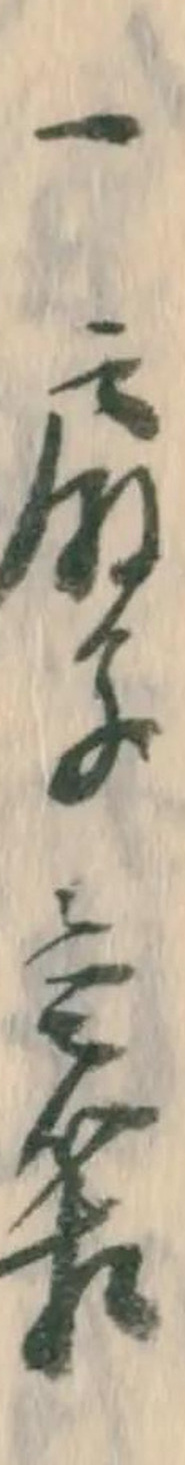一扇子壱箱
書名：賀茂社記録. 第67冊
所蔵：国立国会図書館 National Diet Library, JAPAN
